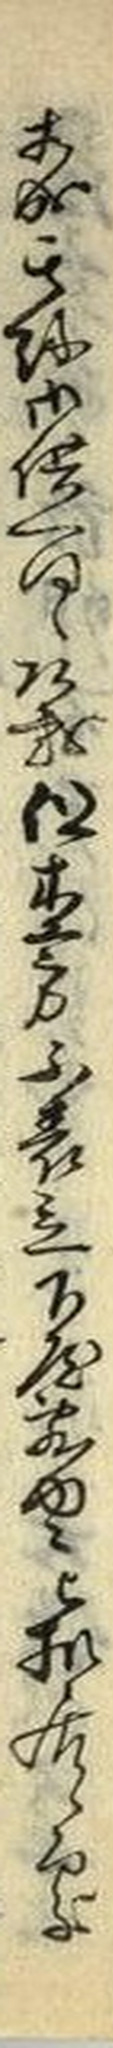相成其余御供一同へ頂戴但木工方不表立下屋敷内ニ被相居候処
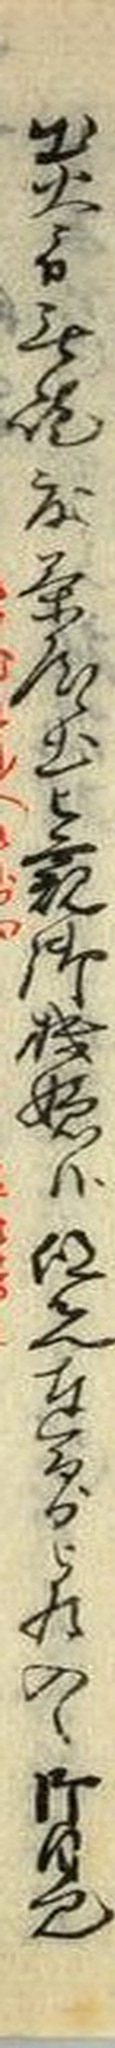出火ニ付無屹度茶屋へ出被窺御機嫌候但先達而ゟ被為入候御目見
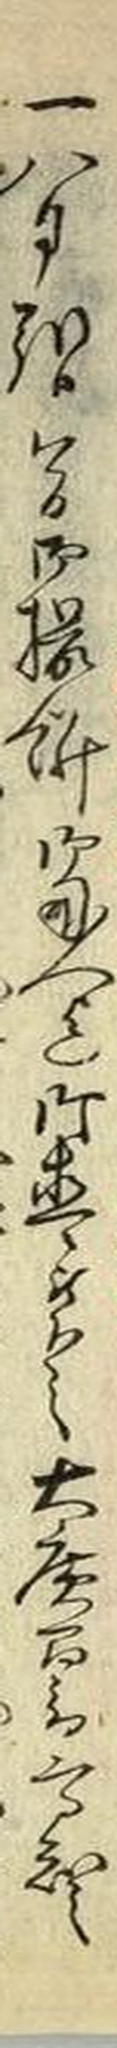一八月朔日今日御撮餅御用人迄御直ニ被下之大広間ニ而高知之
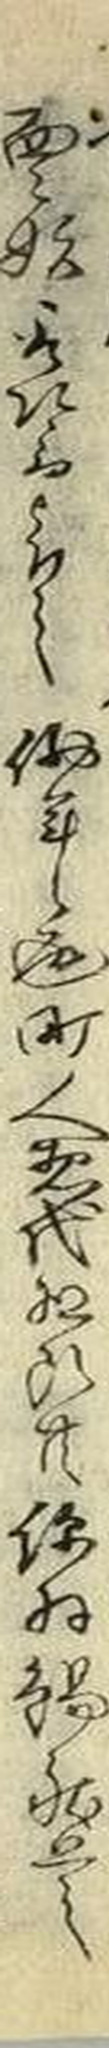面々始取次ニ而被下之例年之通町人惣代組頭共綿羽鯣献上之
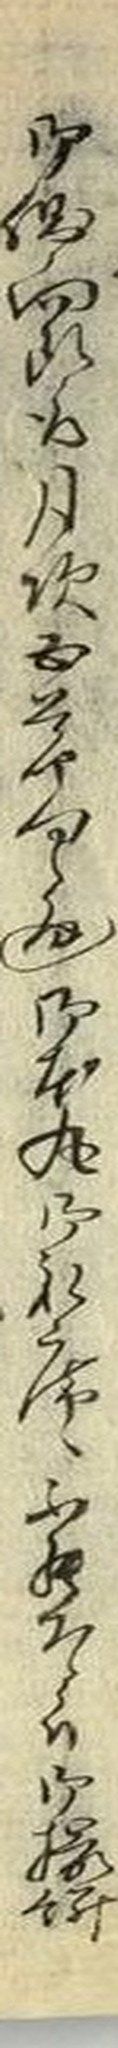御側向頭取月次五節句之通御本丸御礼席へ不罷出候ニ付御撮餅
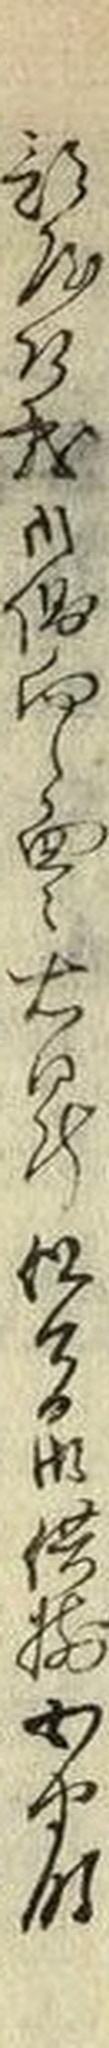部屋頂戴御側向之面々右同断但今日御供揃五半時
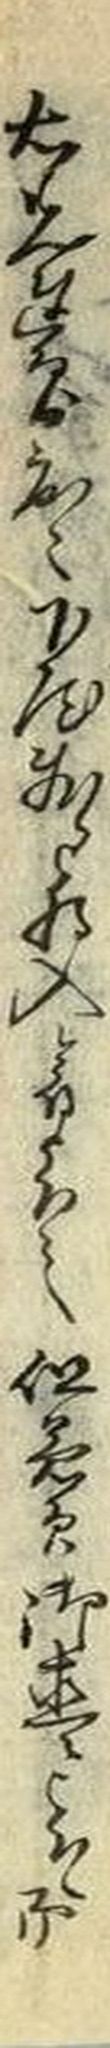右先達而ゟ度々下屋敷へ被為入候ニ付被下之但兼而ハ御直ニ被下候御
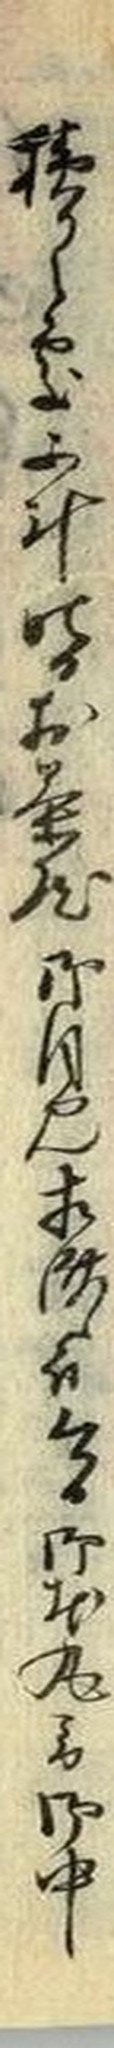積り之処不計昨日於茶屋御目見相済候ニ付今日御本丸ニ而御中
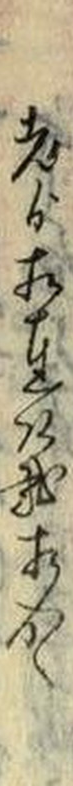老ゟ相達頂戴相成候
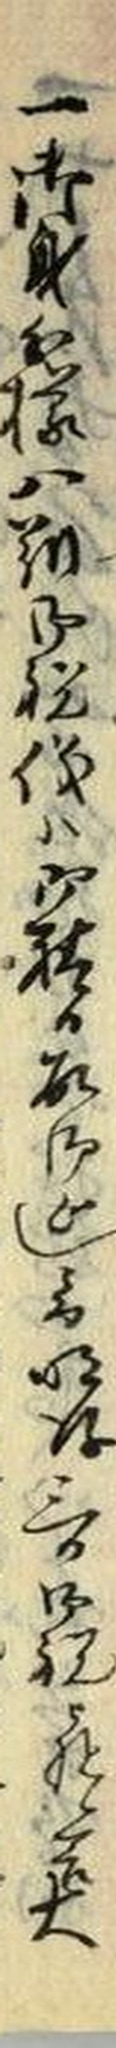一御身分様八朔御祝儀ハ御精日故御延ニ而明後三日御祝被遊候筈大
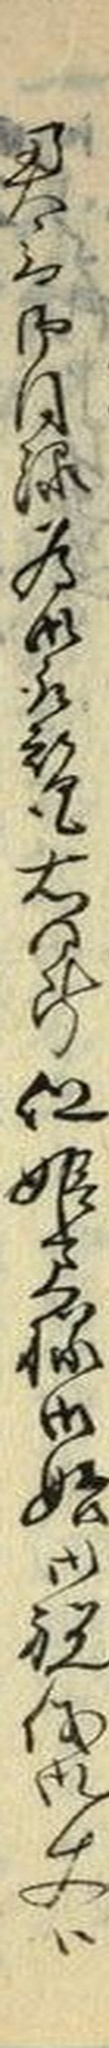奥ニ而御目録以御取替も右同断但姫君様御始御祝儀御使ハ
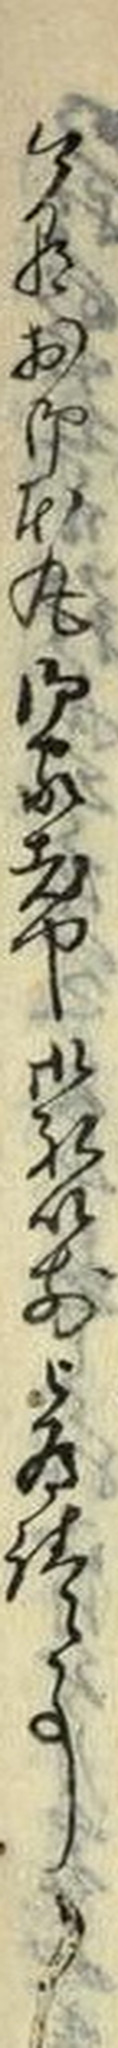今朝於御本丸御家老中御礼以前被為請候事
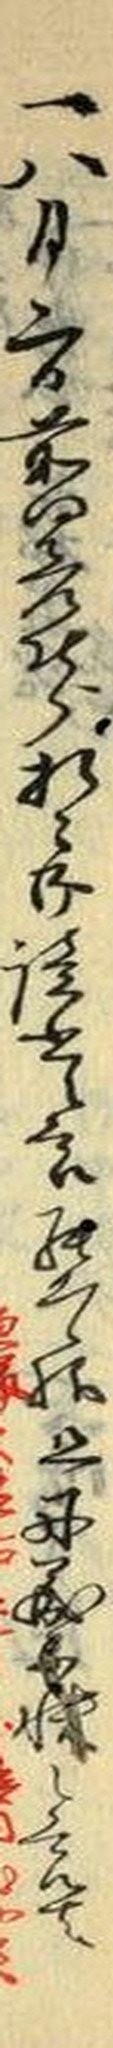一八月二日前田彦次郎折々御読書之節罷出候様且丹蔵不快之節者
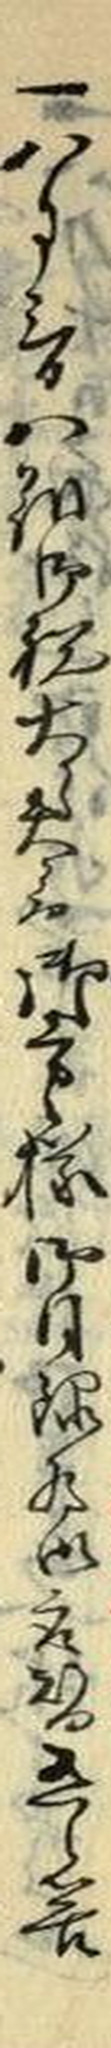一八月三日八朔御祝大奥ニ而御方々様御目録為御取替有之筈
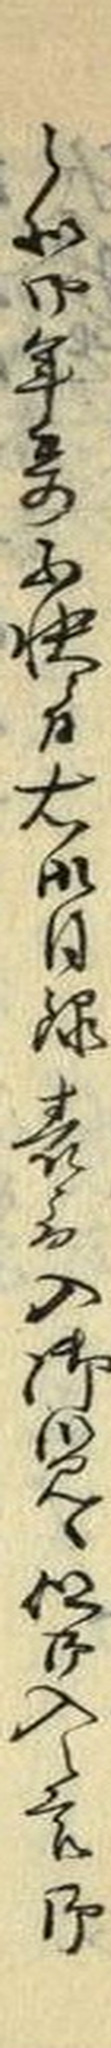之処御年寄不快ニ付右御目録表ニ而入御覧候但御入之節御
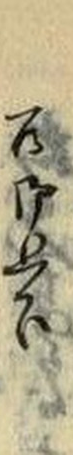召御上下
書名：少傅日録抄（斉承付側向頭取日記、在国）
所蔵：福井県文書館 Fukui Prefectural Archives
